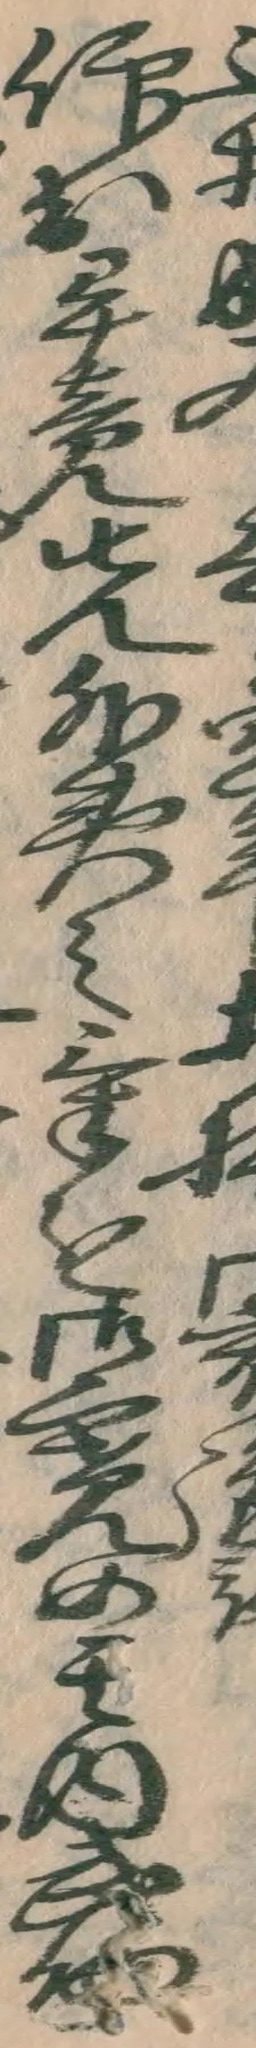仰出畢竟先外夷之氣を御寬め其内武物
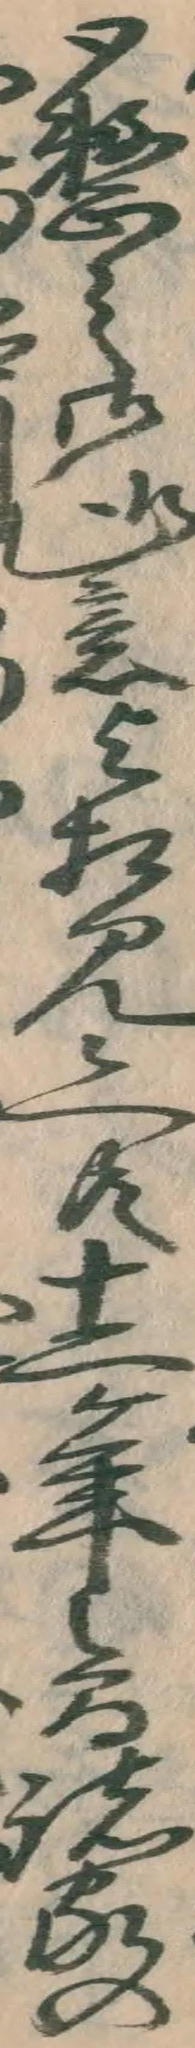御整之御趣意と相見候へ共十二ケ年之間諸家の
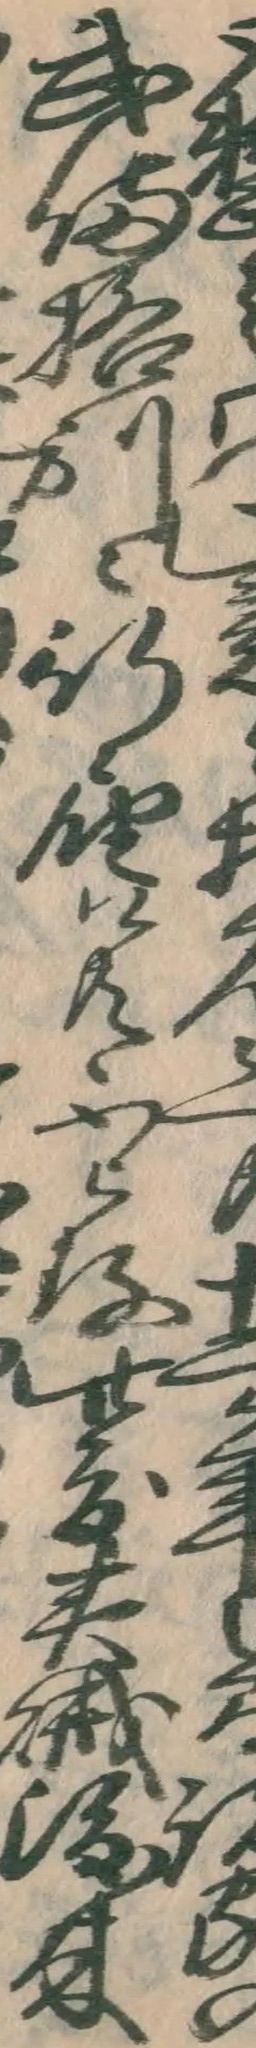武備格別ニ行届候共不被存此度夷賊渡来
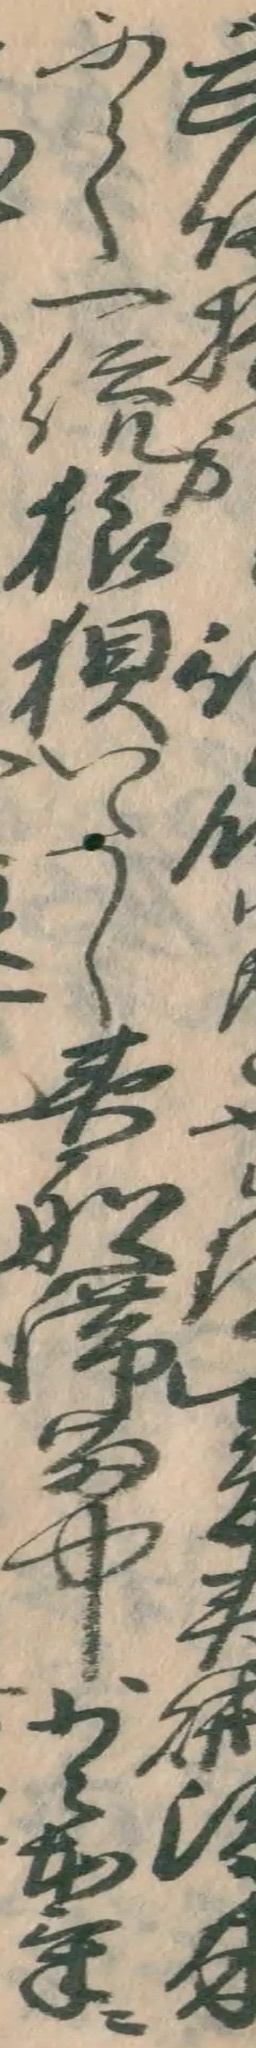にて一統狼狽いたし夷船滞留中少々本氣ニ
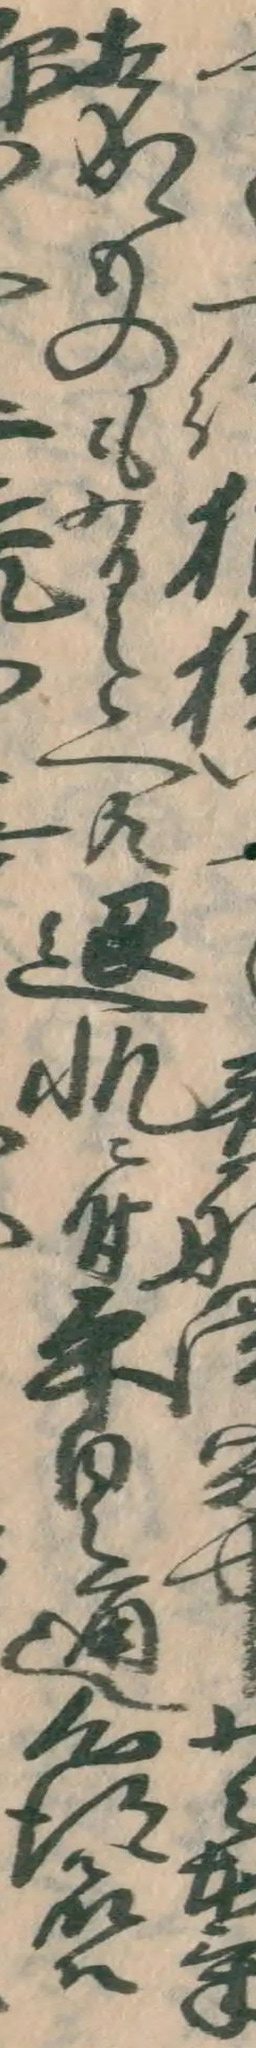相成候ものも有之候へ共退帆ニ付平日之通心得候様被
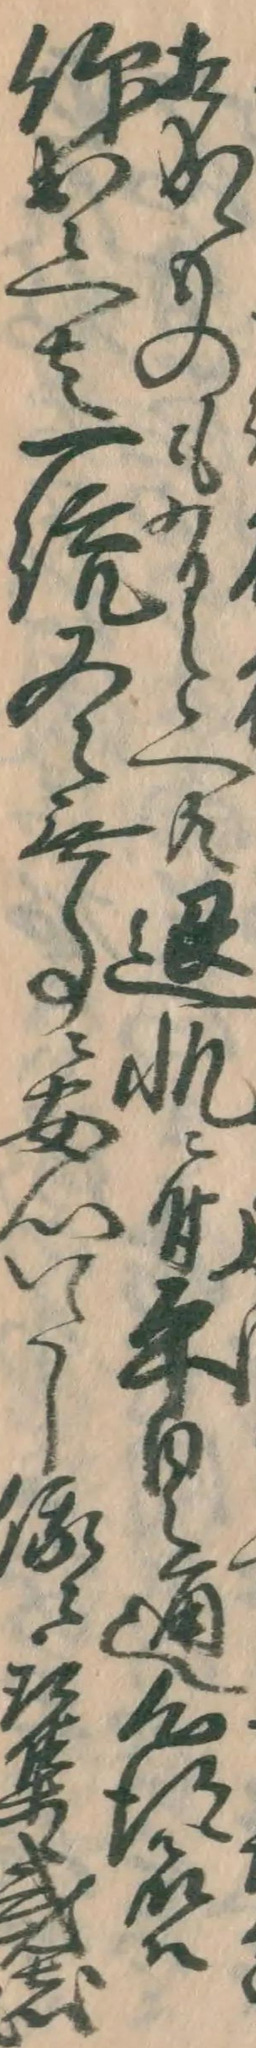仰出候へ者一統又々無事ニ安心いたし俄ニ取集候武器も
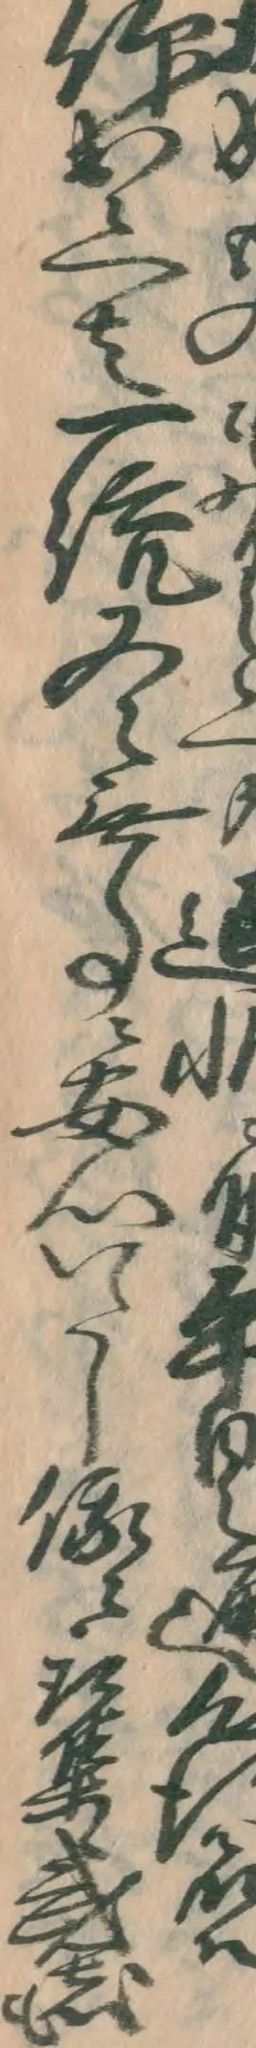仰出候へ者一統又々無事ニ安心いたし俄ニ取集候武器も

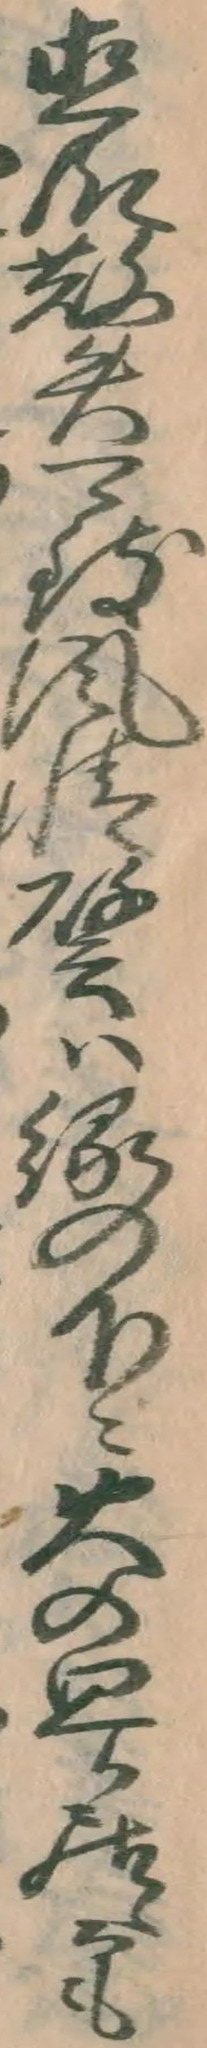直様散失可致風情譬ハ縁の下ニ火の廻り居候而も
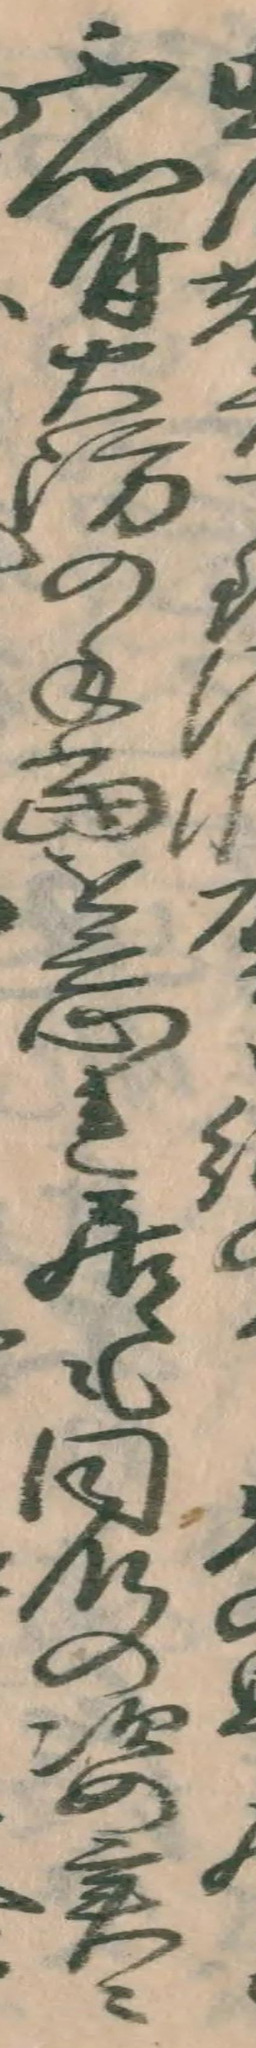不心付火防の手當を忘れ居候も同様の姿実ニ
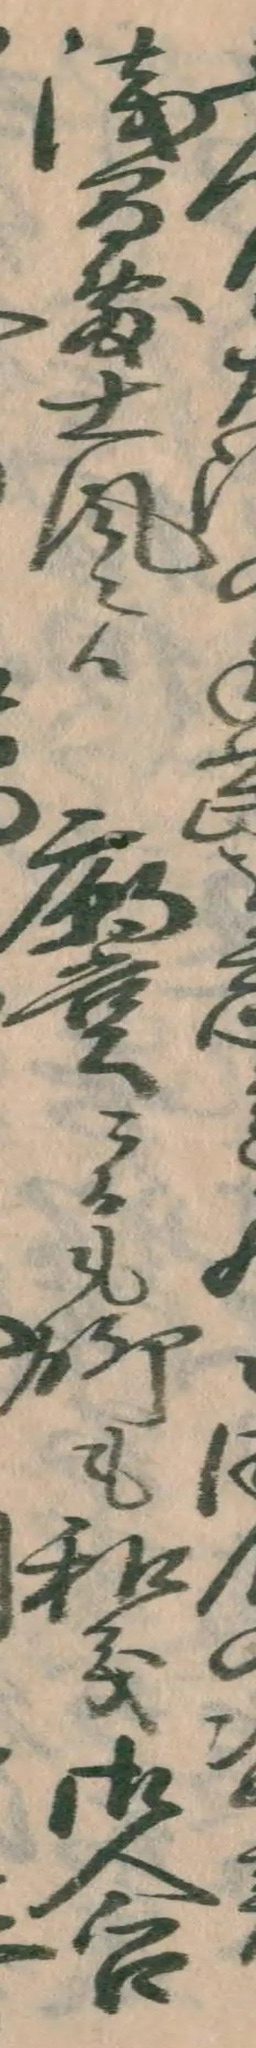浅間敷士風ニ候廟堂ニ而も聊も和義御含
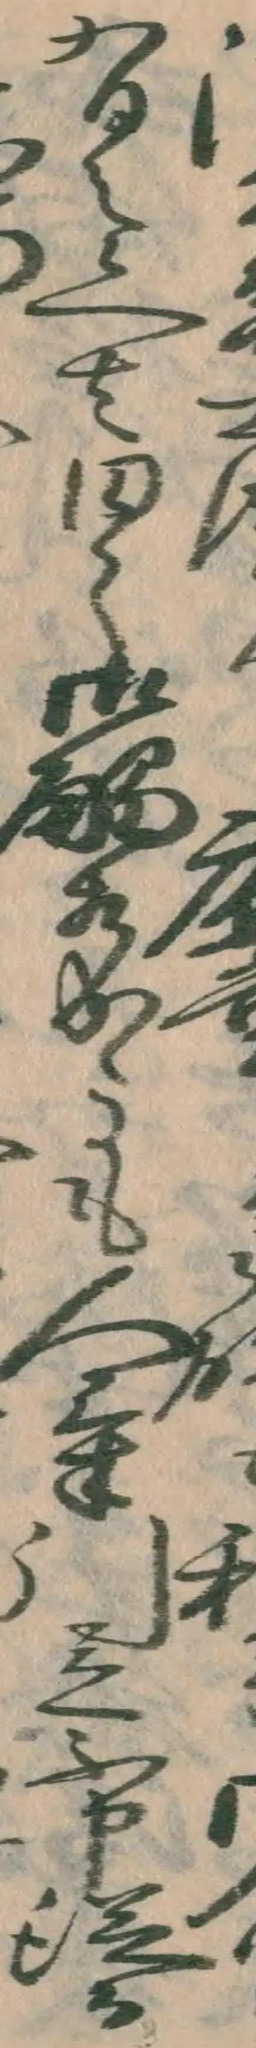有之候へ者日々御觸相成候にも人氣引立不申従而
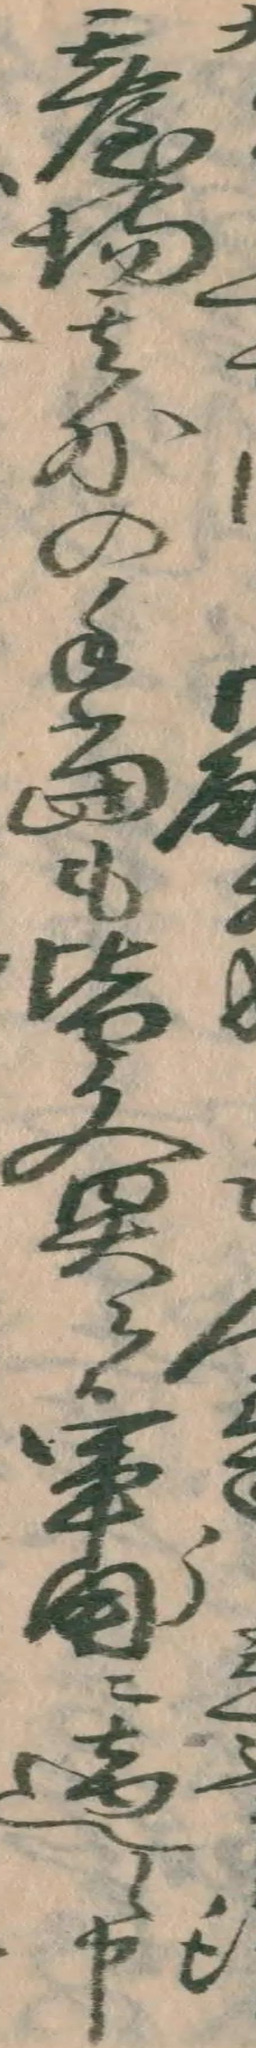臺物其外の手當も皆文具ニ而軍用ニ適し申
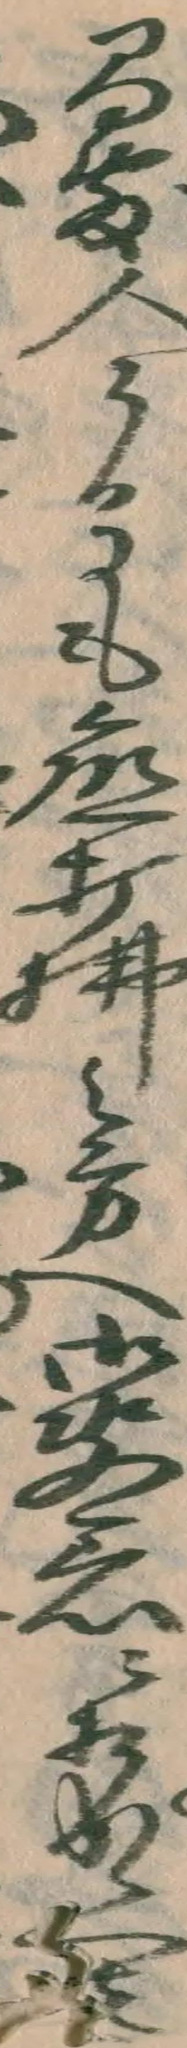間敷今日にも愈打拂之方へ御決着ニ相成候へ共
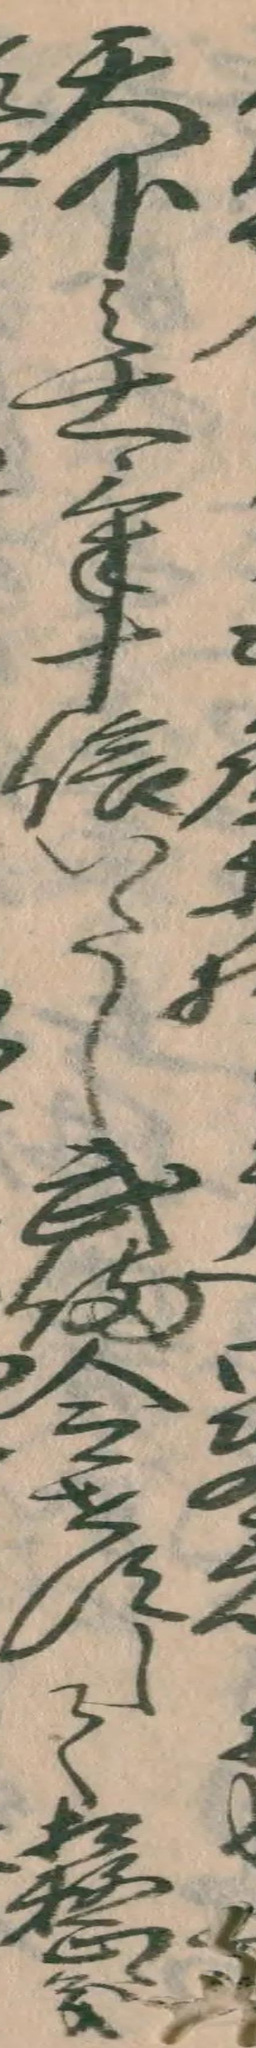天下之士氣十倍いたし武備令せすして相整候義
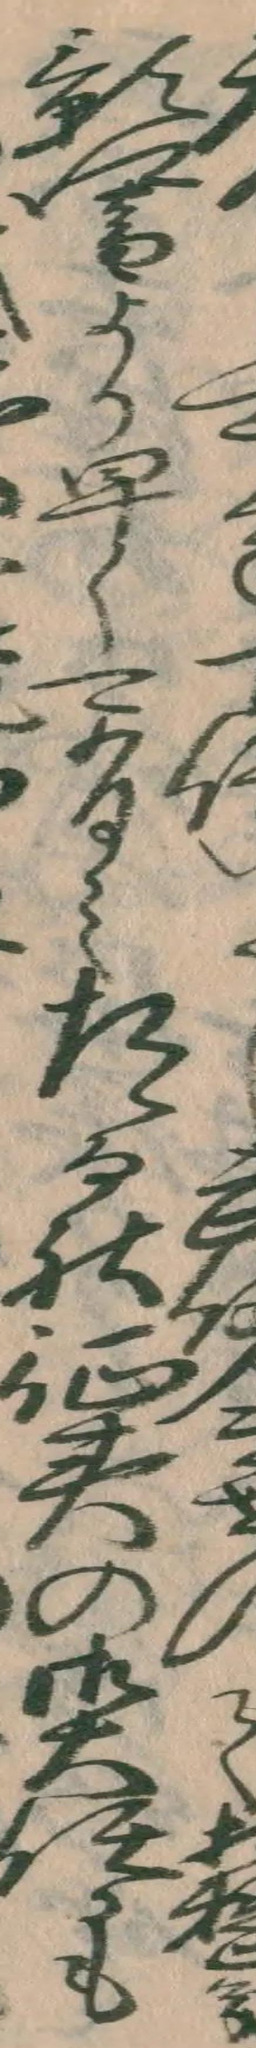影響より早く可有之左候而社征夷の御大任二も
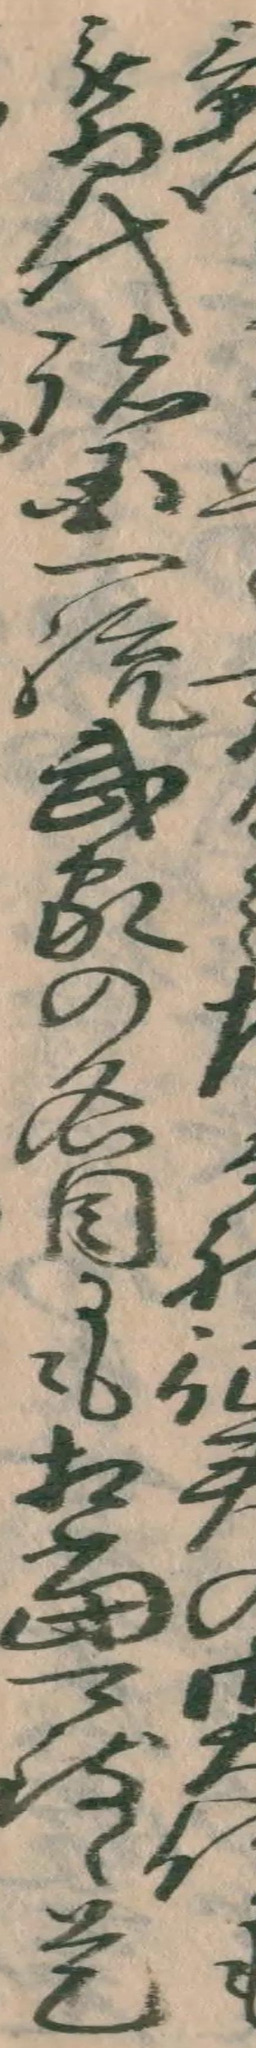被為代諸国一統武家の名目にも相當可致候是
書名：麗斎叢書. 20
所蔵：国立国会図書館 National Diet Library, JAPAN
